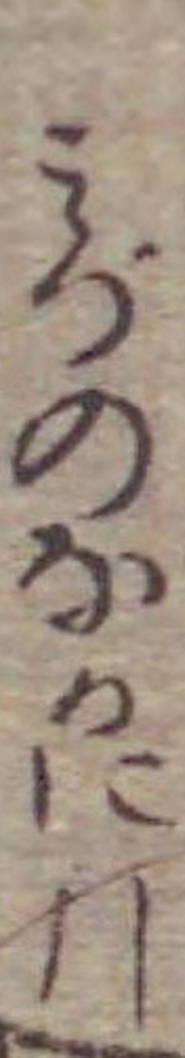みづのなかに引
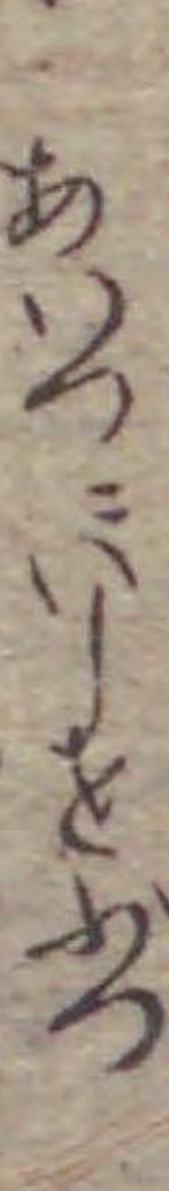あいつにいしをぶつ
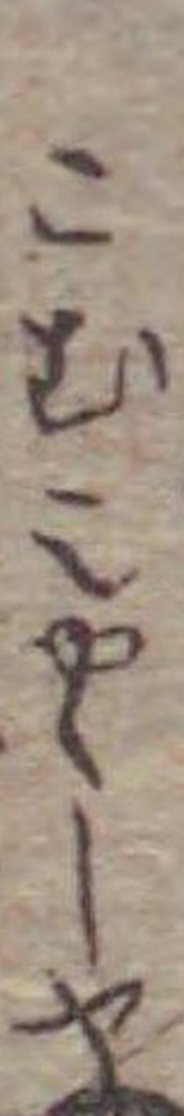こむ也やくしや
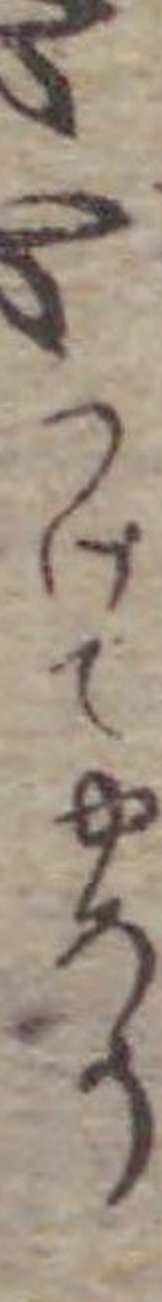つけてやろう
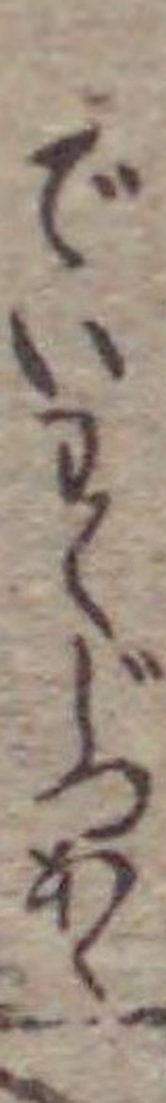でいわくじつあく
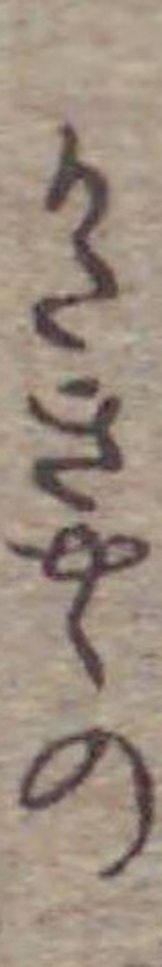かたきやくの
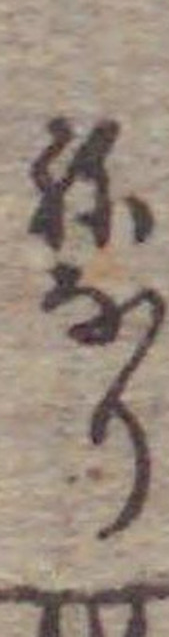ねなり

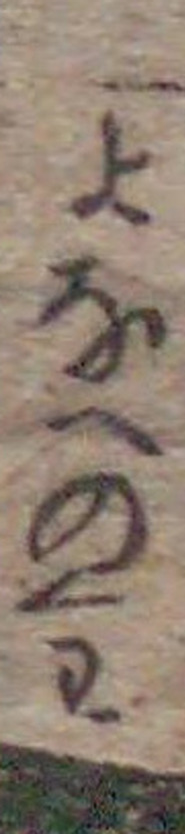よなへのくわ
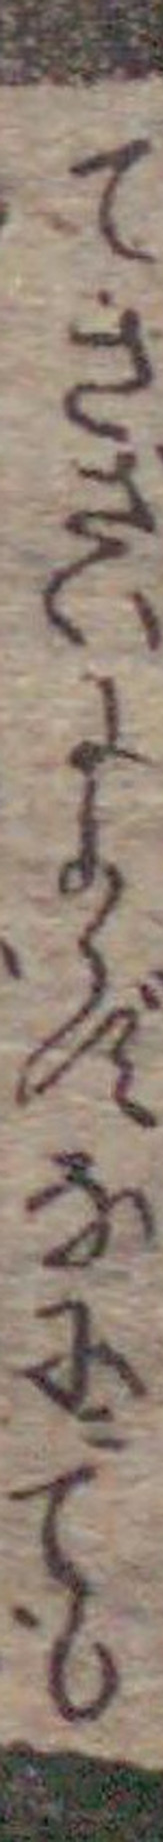てきざいによらずなににても
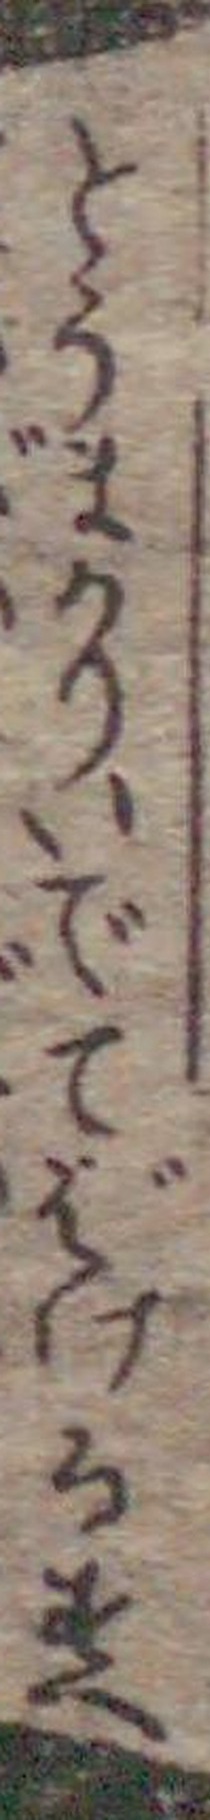とうまかりいでてばけるすへ
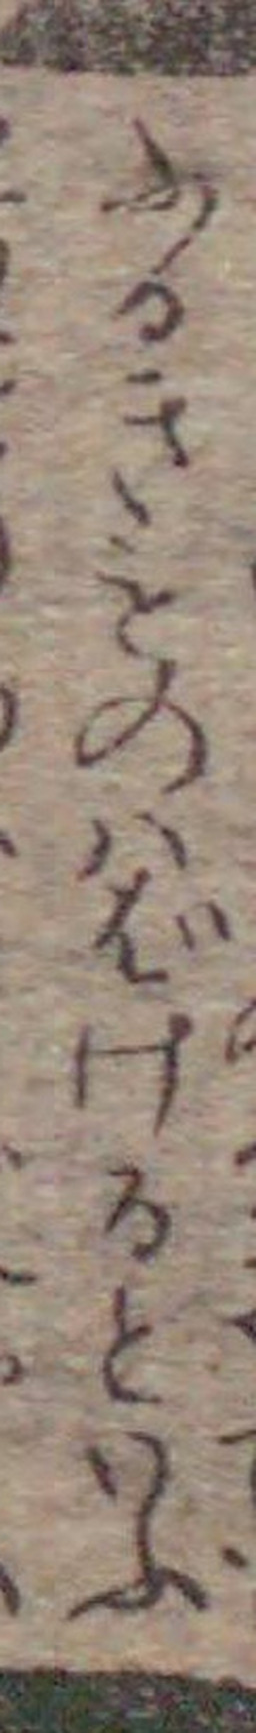ふるきものはばけるといふ
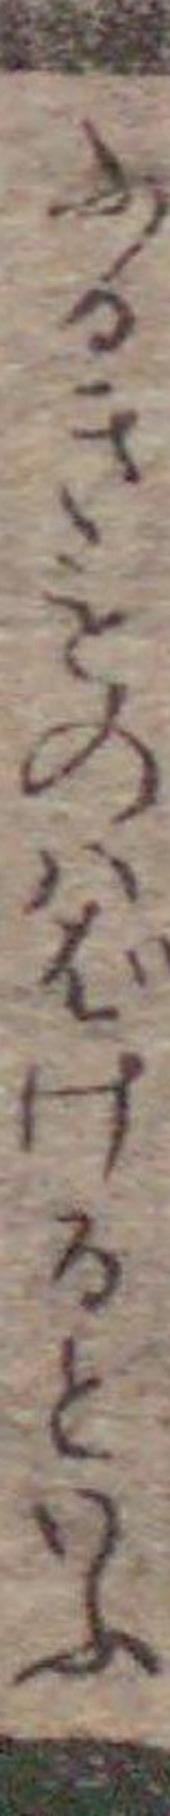ふるきものはばけるといふ
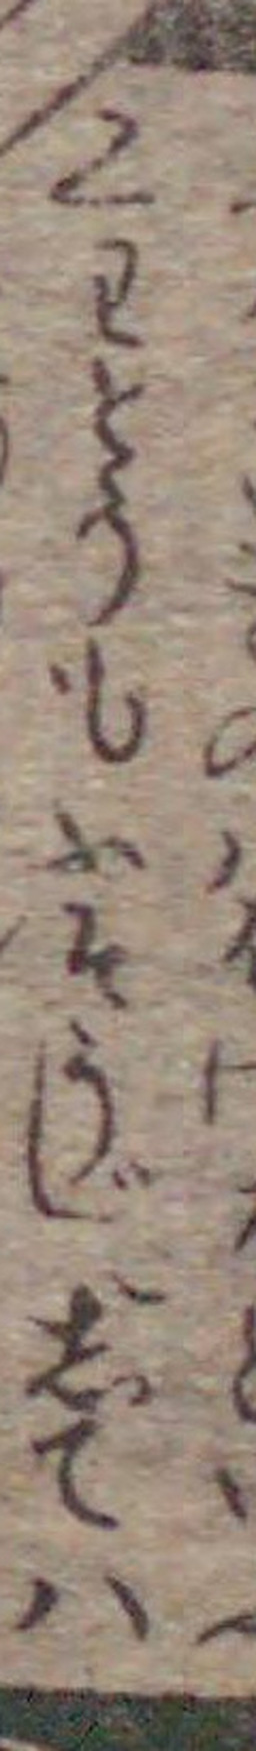くわとうもふそうじにしては
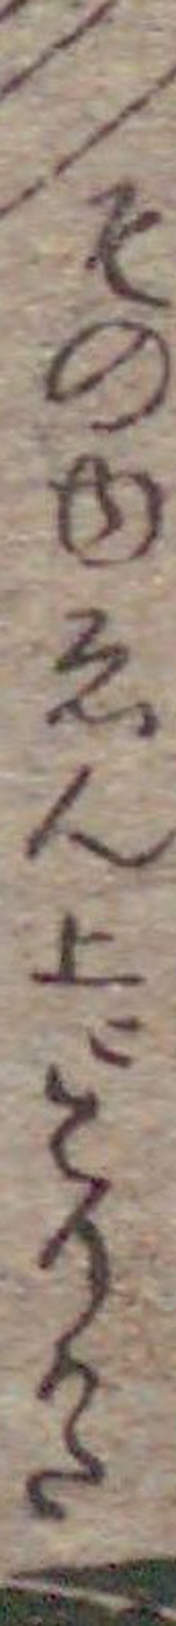そのゆゑん上にとりかた
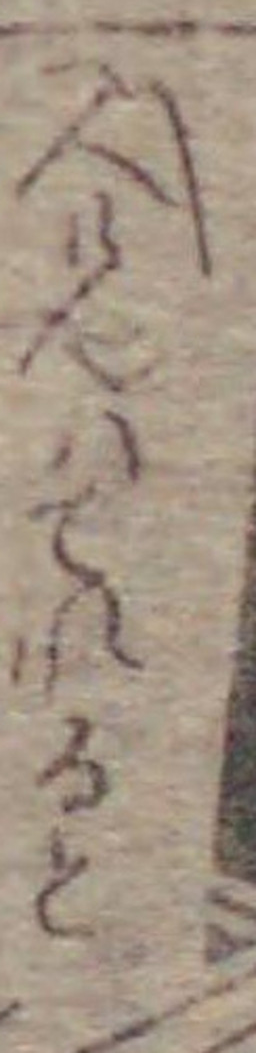〽人けんはてれると
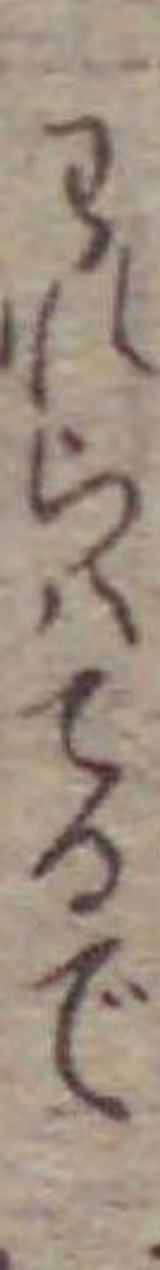われらはてるで
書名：妖怪仕内評判記 : 2巻
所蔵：国立国会図書館 National Diet Library, JAPAN
